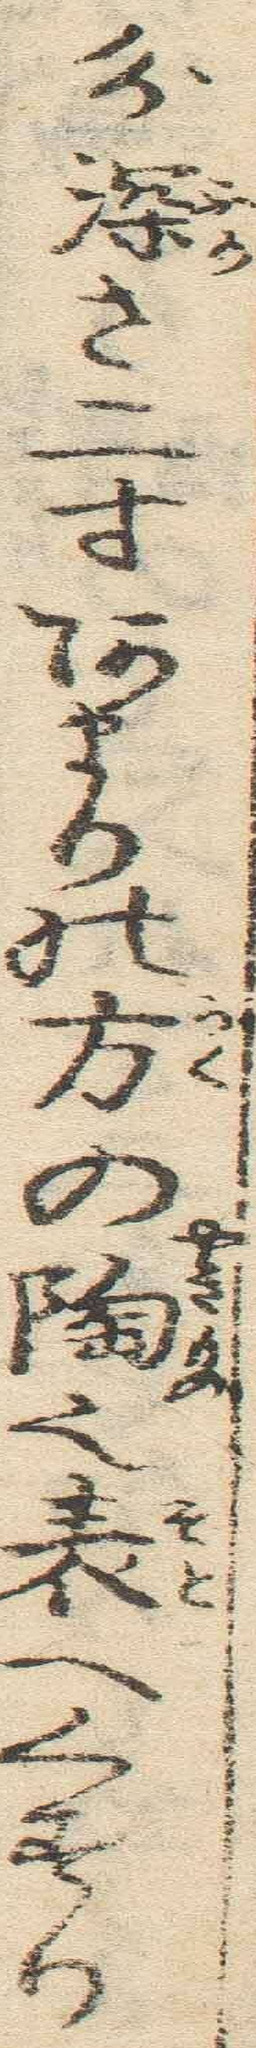分深さ二寸あまりの方の陶也表へくすり
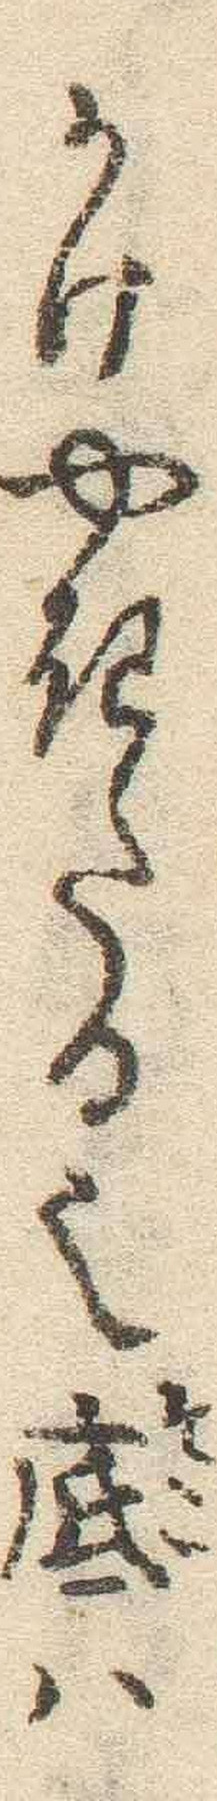かけやきたる也底は
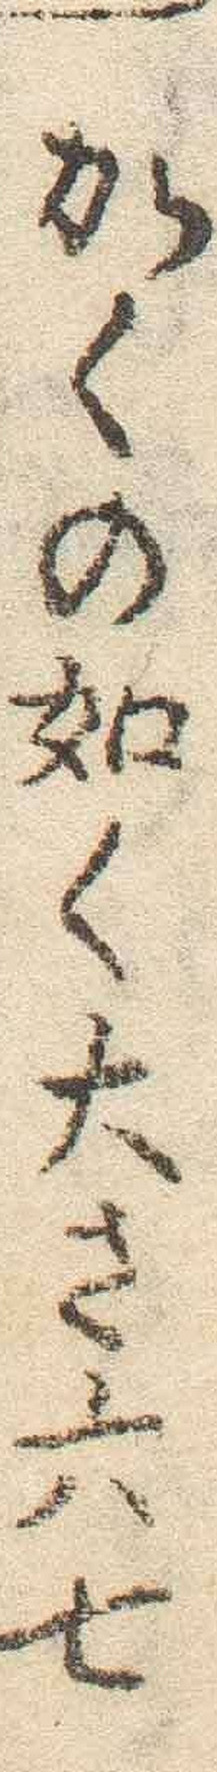かくの如く大さ六七
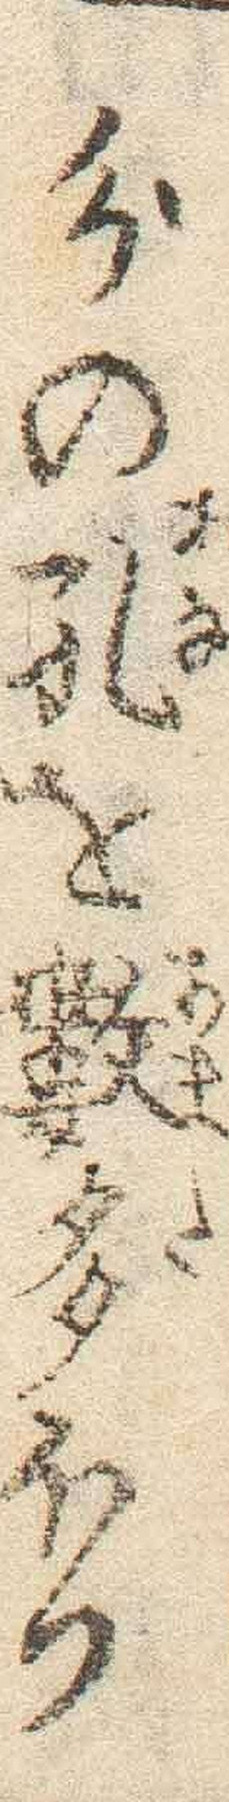分の孔を数多ほり
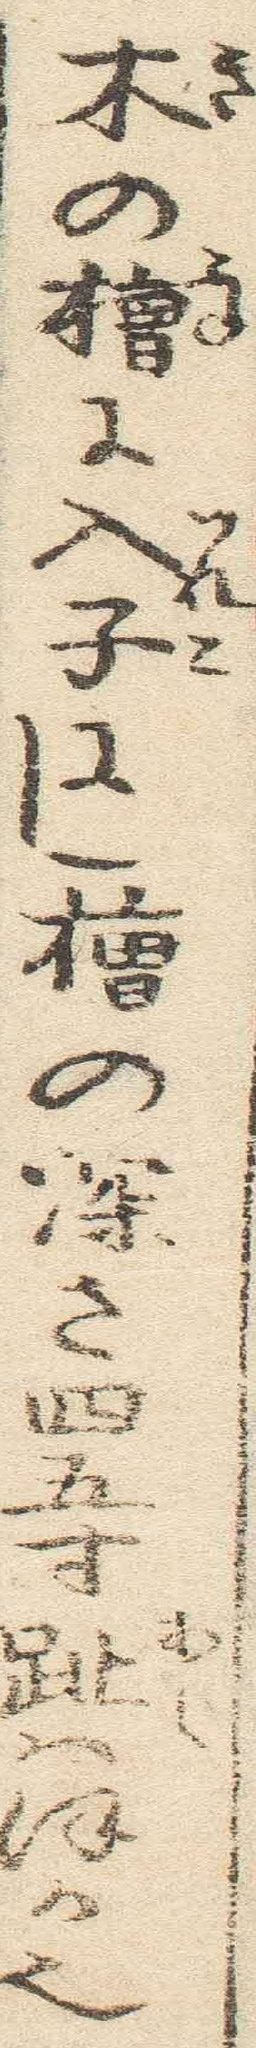木の槽に入子にし槽の深さ四五寸趾はほか也
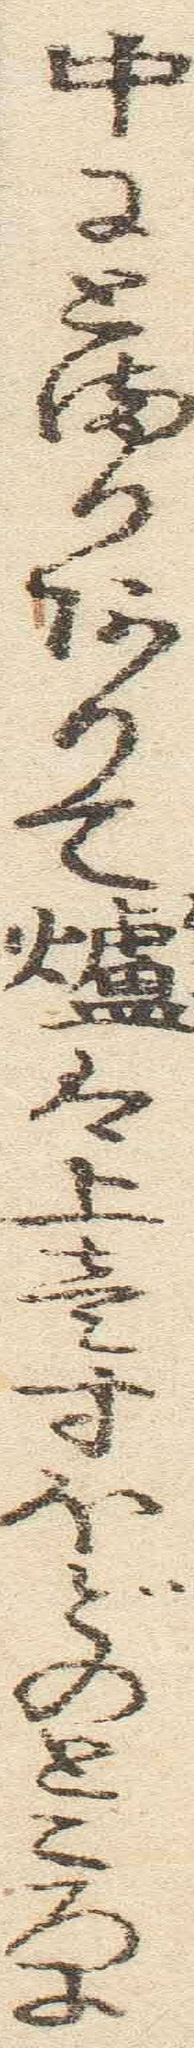中にとまりありて爐は上壱寸ほどのところに
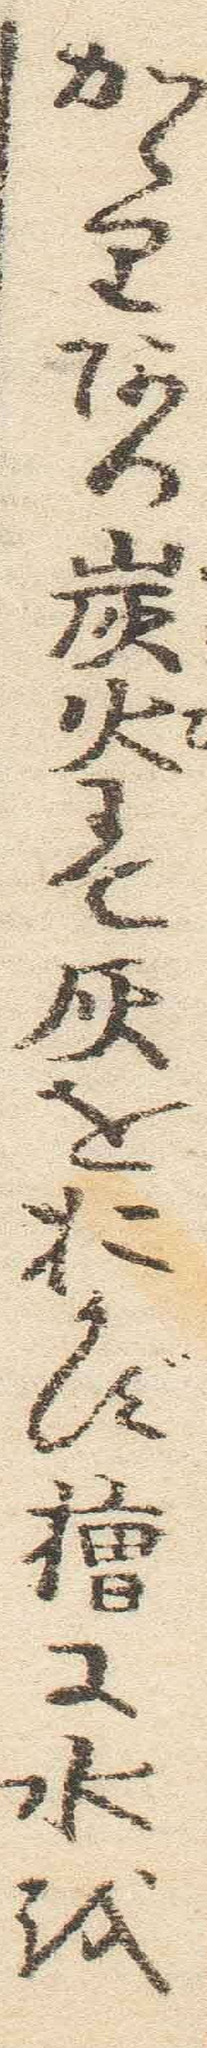かゝりあり炭火にて灰をおかず槽に水を
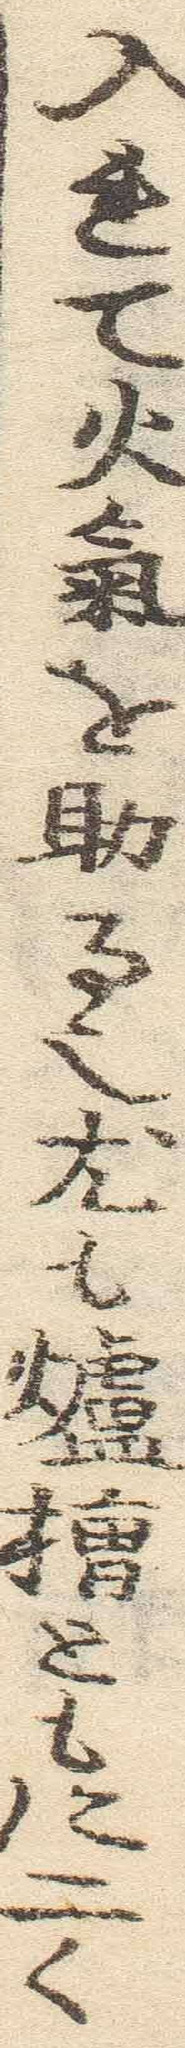入れて火気を助る也尤も爐槽ともに二く
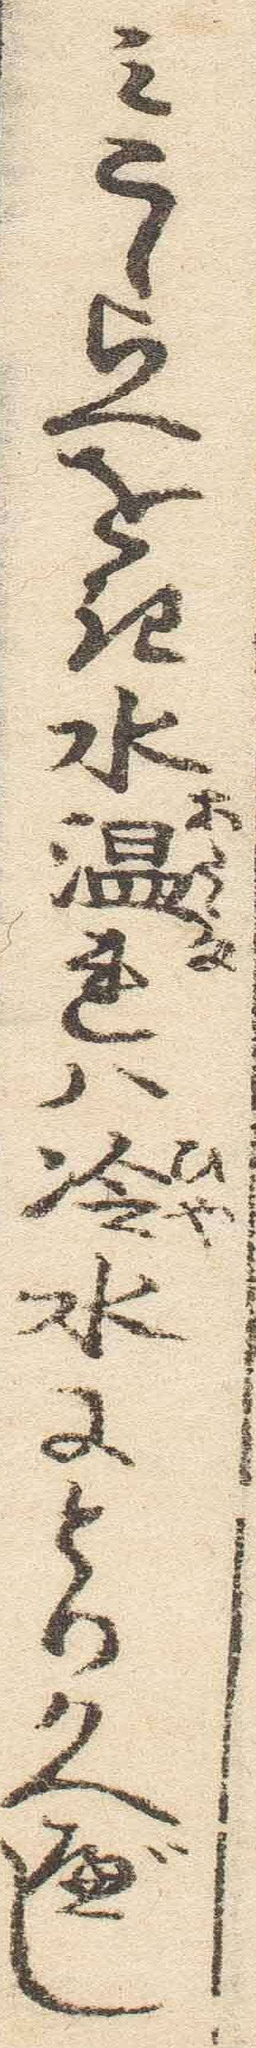みこしらへをき水温れは冷水にとりかへべし
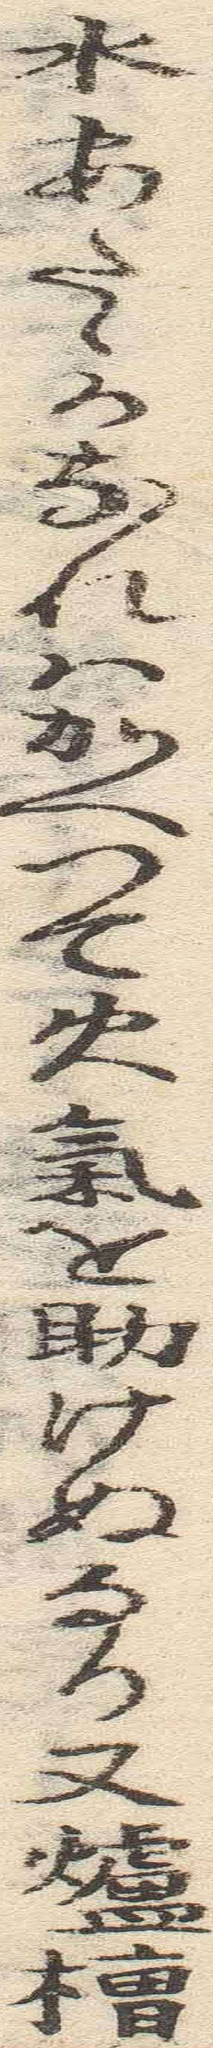水あたゝかなれはかへつて火気を助けぬなり又爐槽
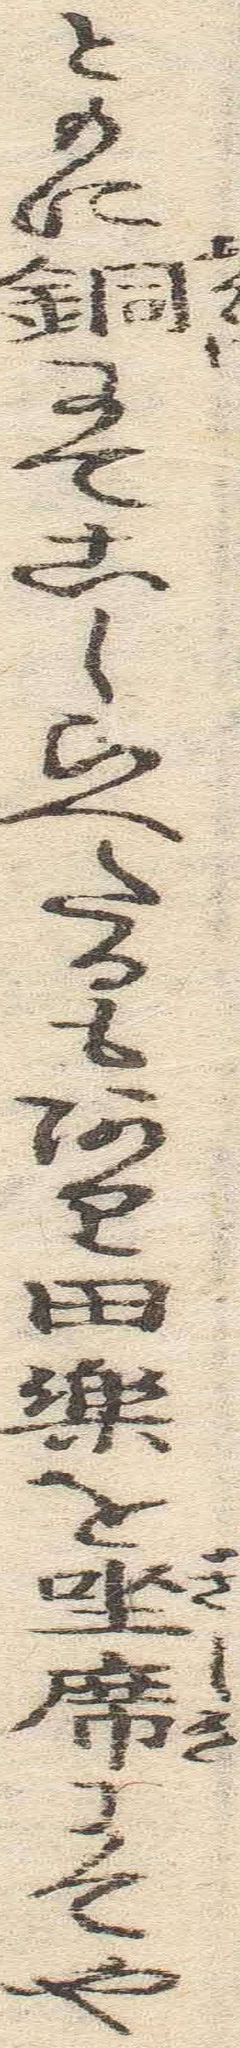ともに銅にてこしらへたるもあり田楽を坐席にてや
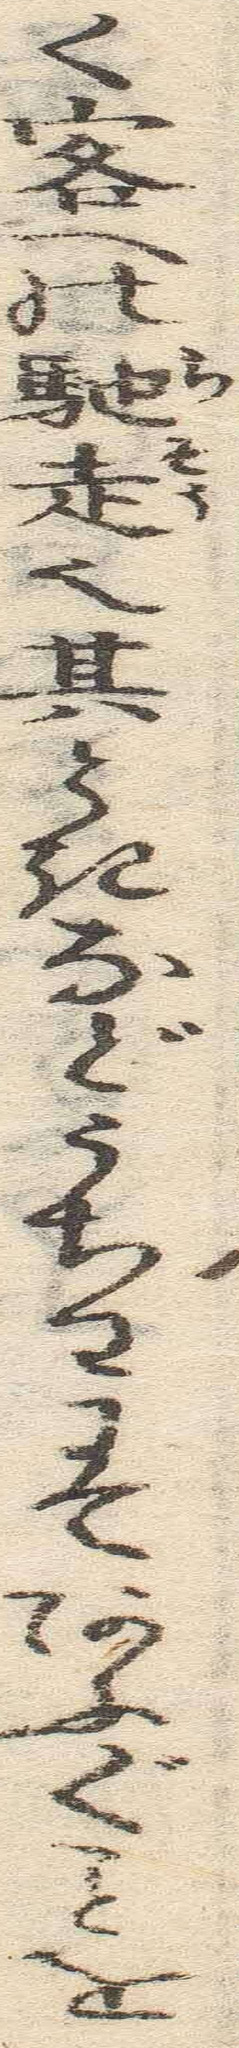く客への馳走也其ときなどうちわにてあふぐことを
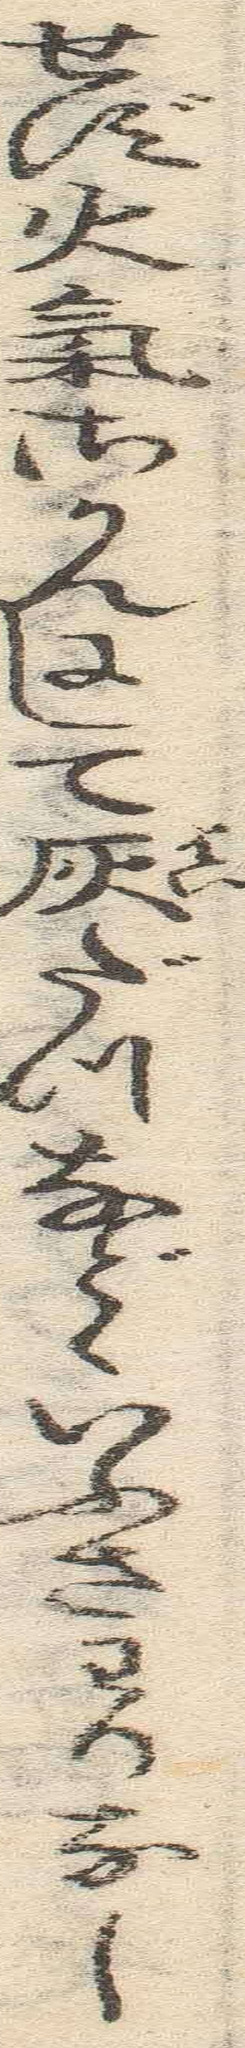せず火気さかんにして灰だつなどゝいふさわりなし
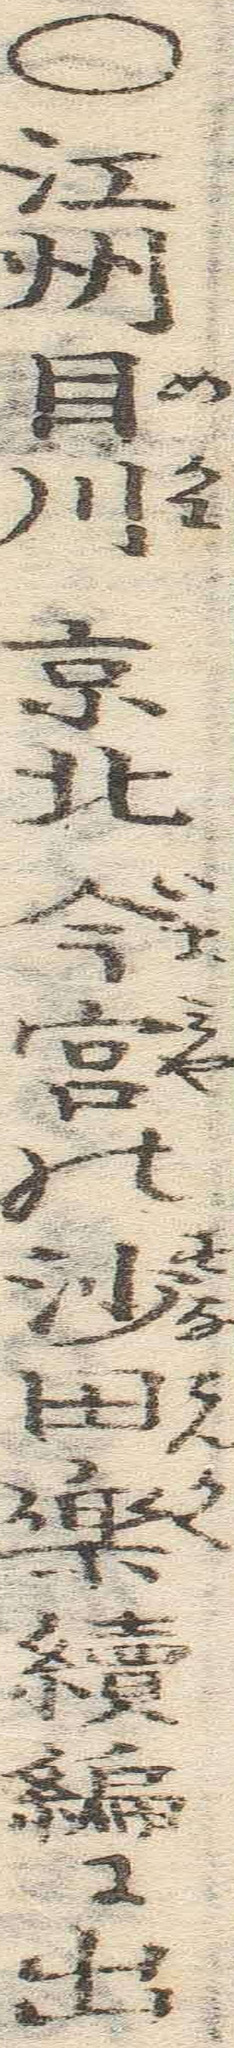○江州目川京北今宮の沙田楽続編に出
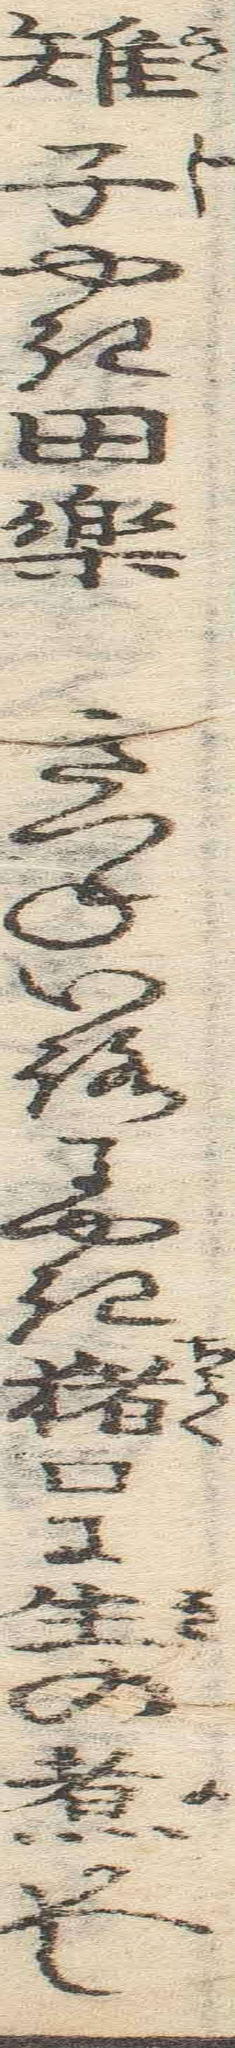[二]雉子やき田楽きつねいろにやき猪口に生の煮かへし
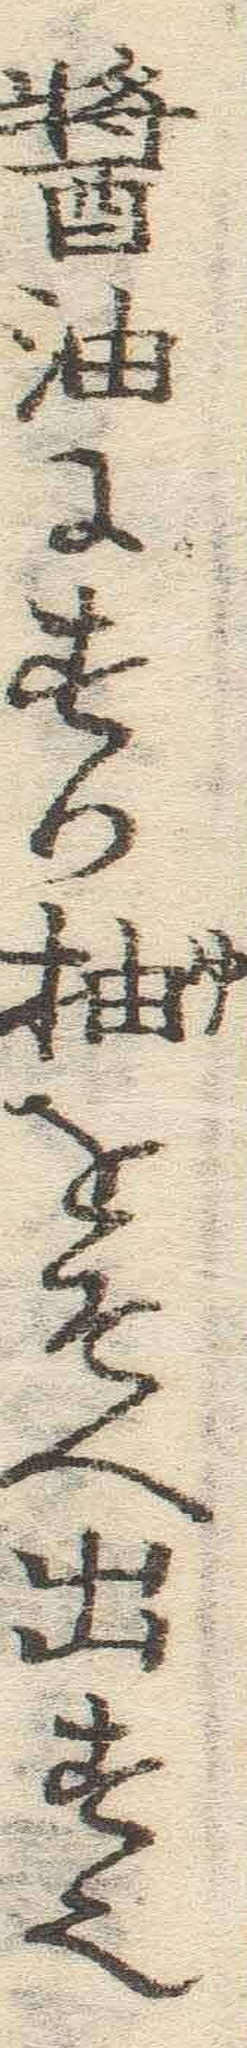醤油にすり柚をそへ出す也
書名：豆腐百珍
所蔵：東京学芸大学附属図書館 国文学研究資料館
